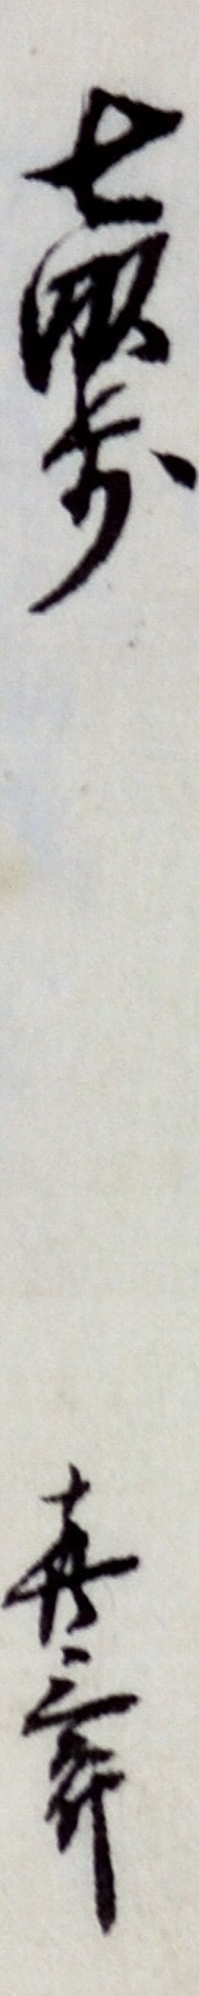七畝歩喜三郎
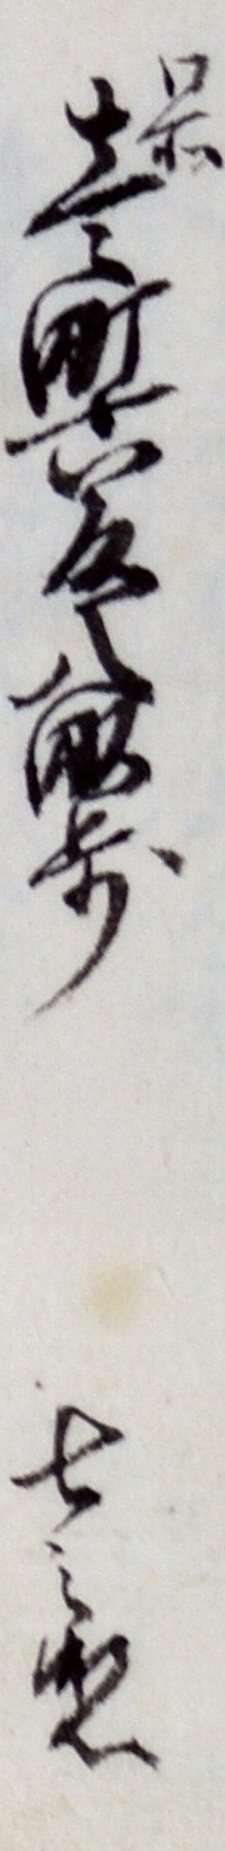壱町六反八畝歩七之烝
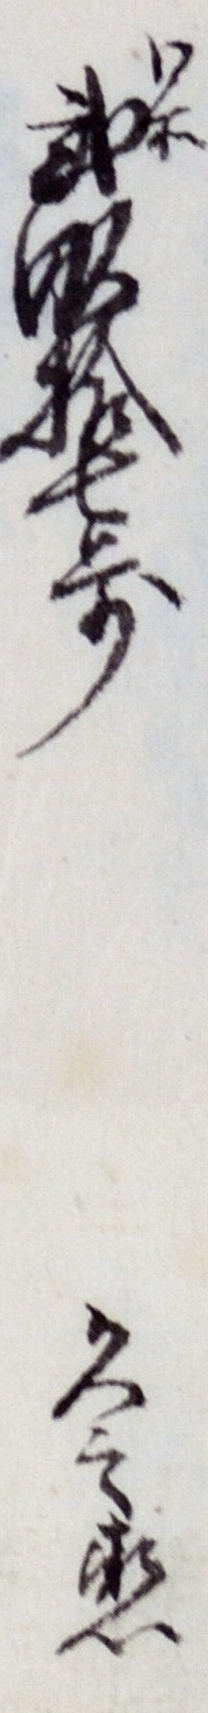弐畝拾七歩久之烝
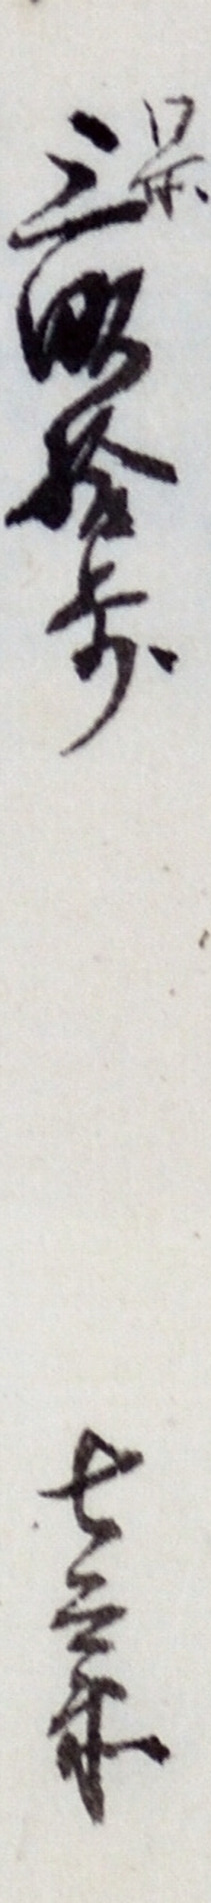三畝拾歩七兵衛
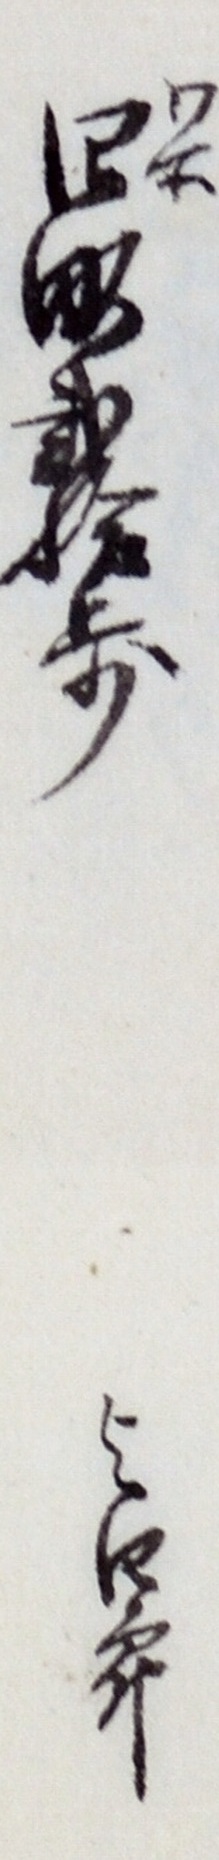四畝弐拾歩与四郎
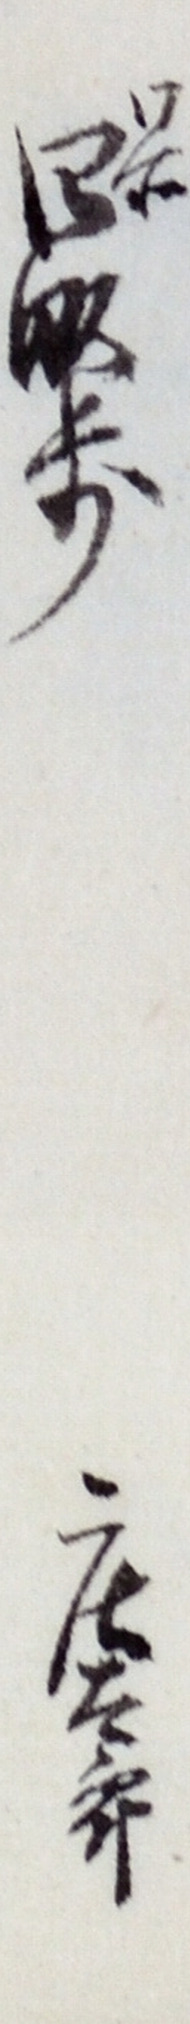四畝歩庄太郎
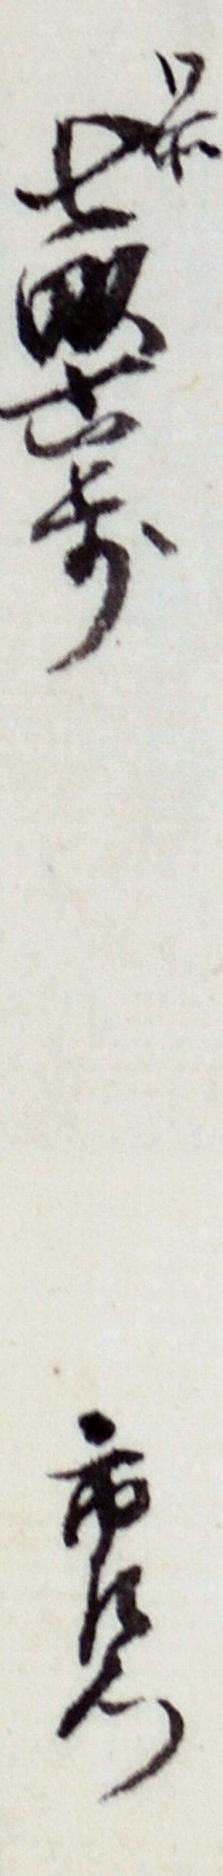七畝六歩市左衛門
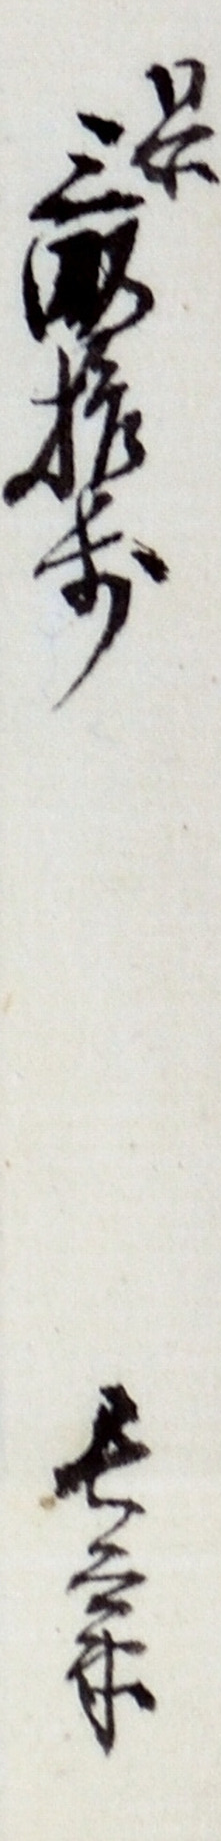三畝拾歩長兵衛
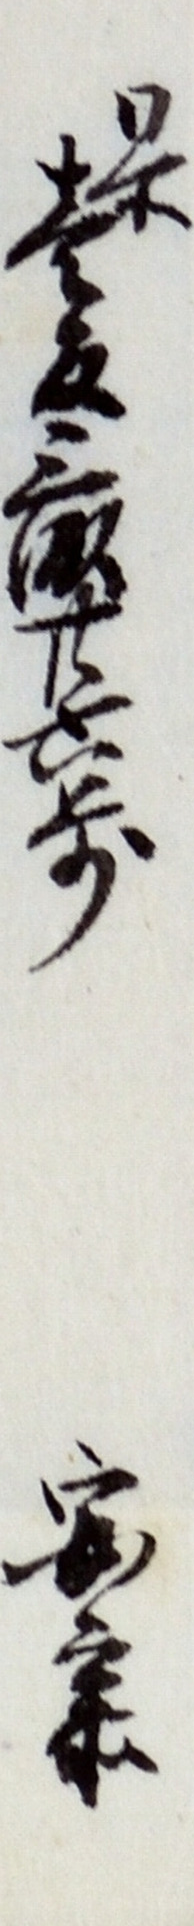壱反三畝廿六歩安兵衛
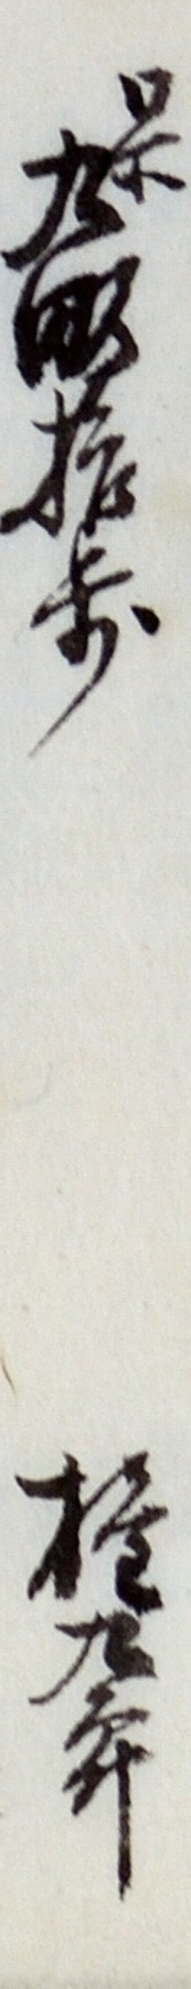九畝拾歩権九郎
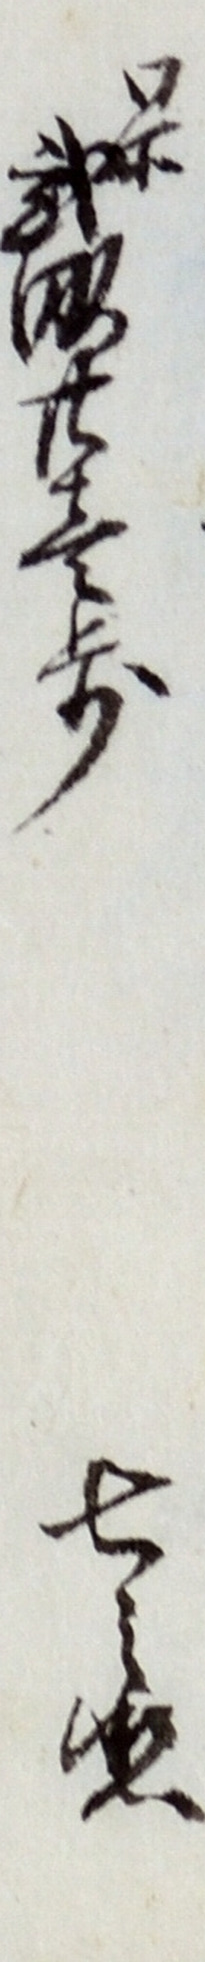弐畝廿壱歩七之烝
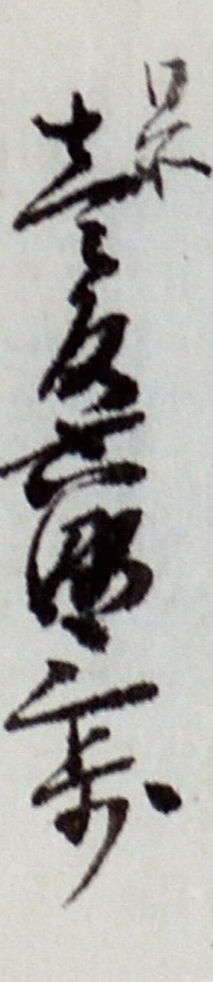壱反六畝三歩同人

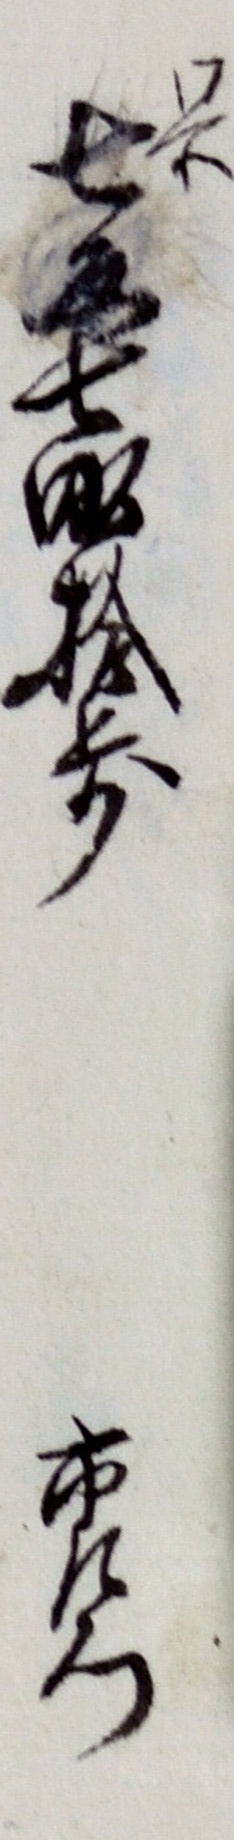七反七畝拾歩市左衛門
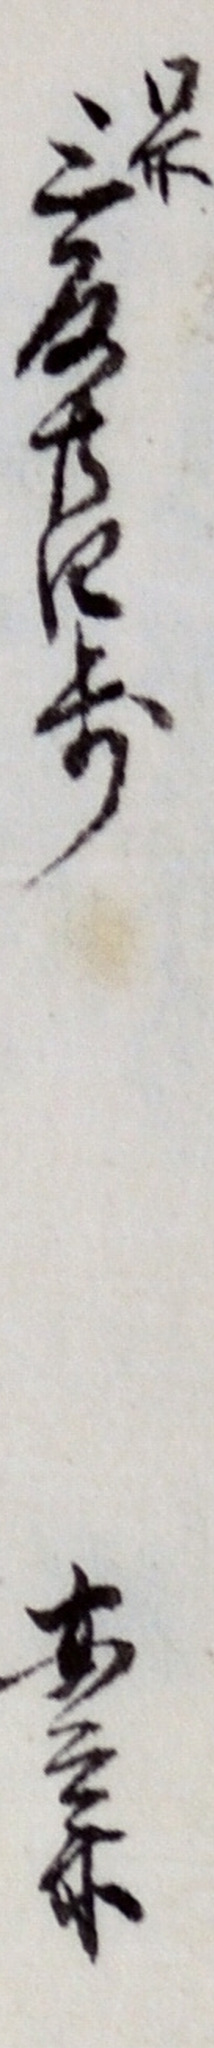三反廿四歩安兵衛
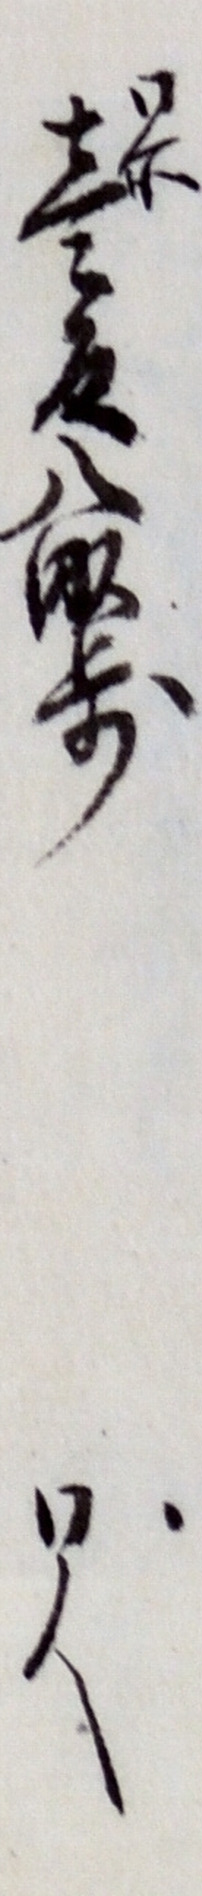壱反八畝歩同人
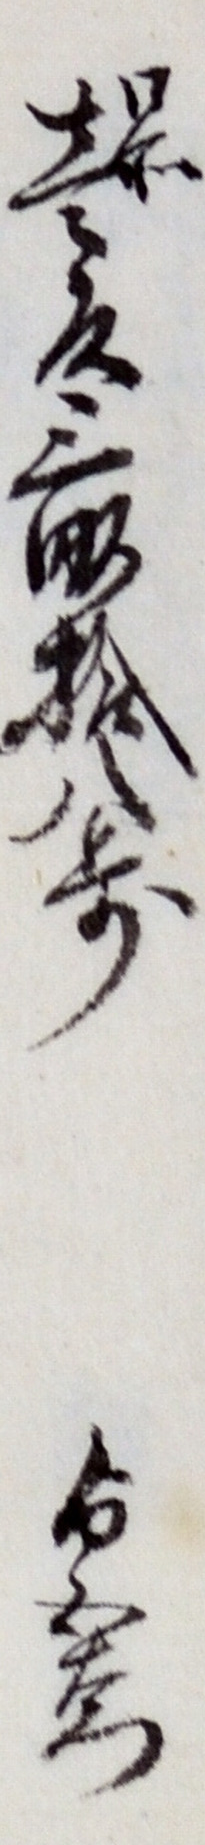壱反三畝拾八歩与五右衛門
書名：御領分中山林社地手控
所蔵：伊那市立高遠町図書館・合同会社AMANE
